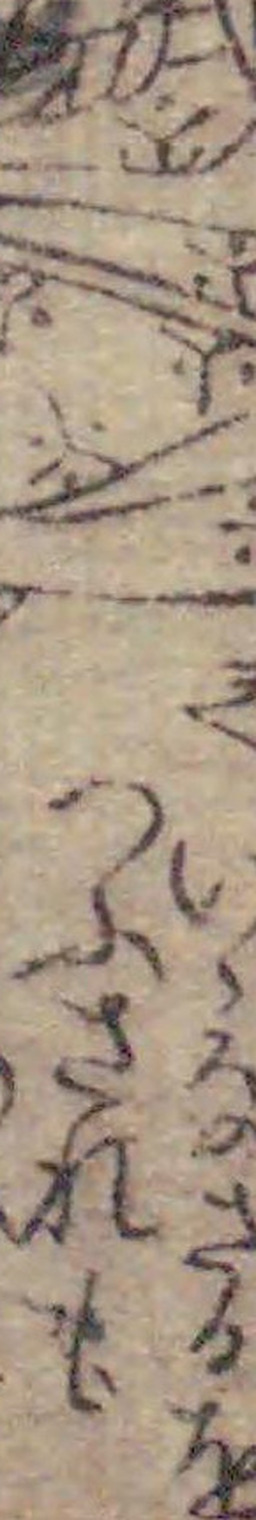つふされも
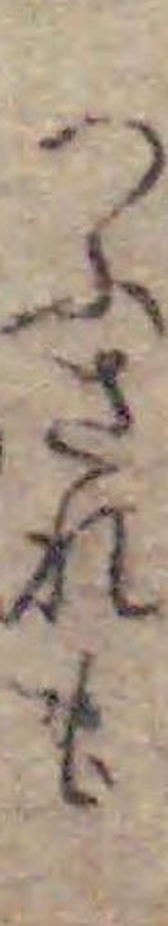つふされも
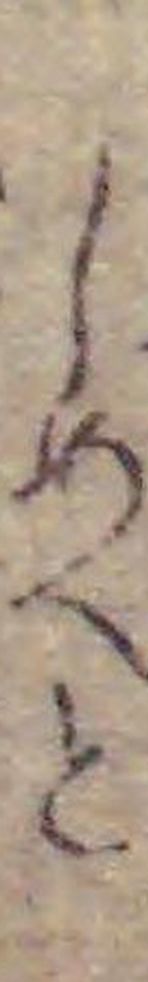しめへと
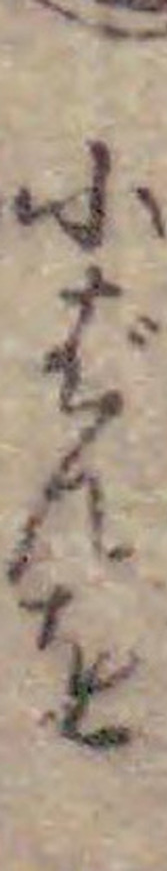小ばんを
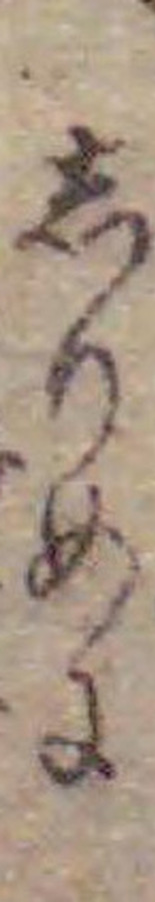しりめに
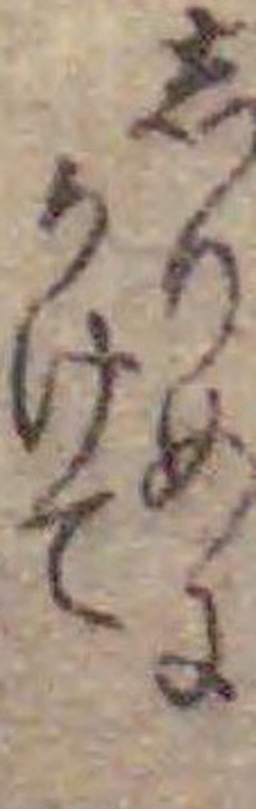かけて

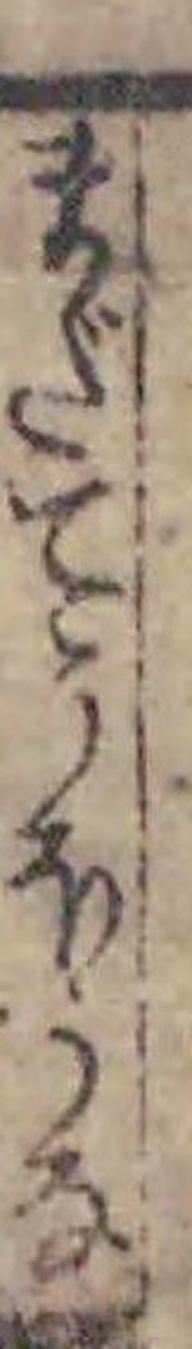まだてうほうな
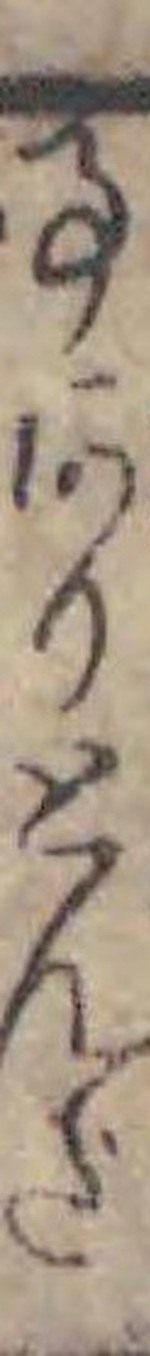事ありとんだ
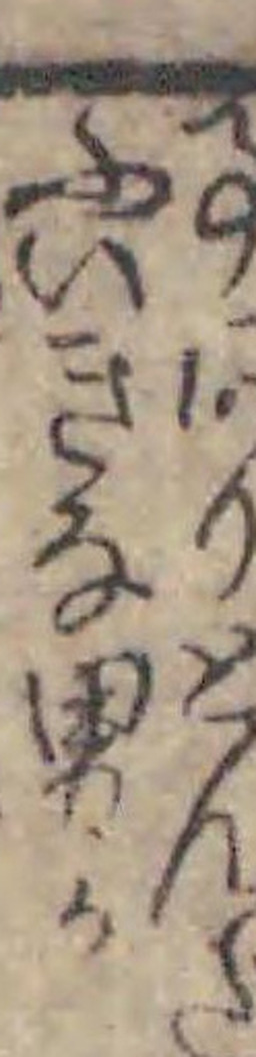ふいきな男か
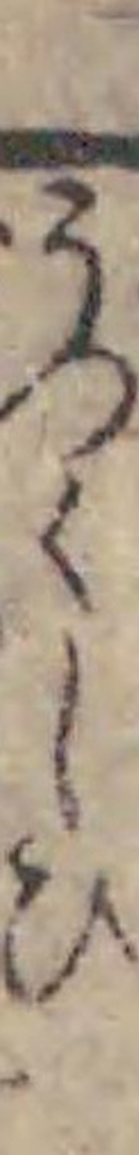うつくしひ
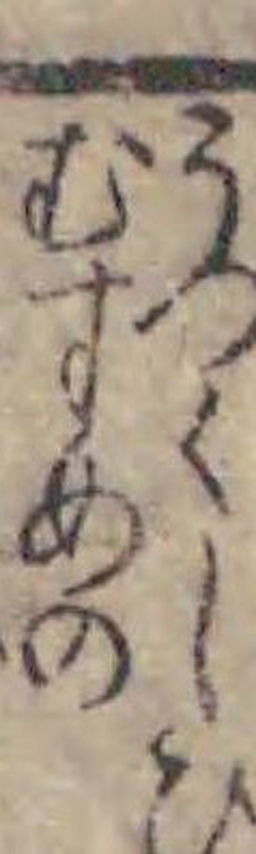むすめの
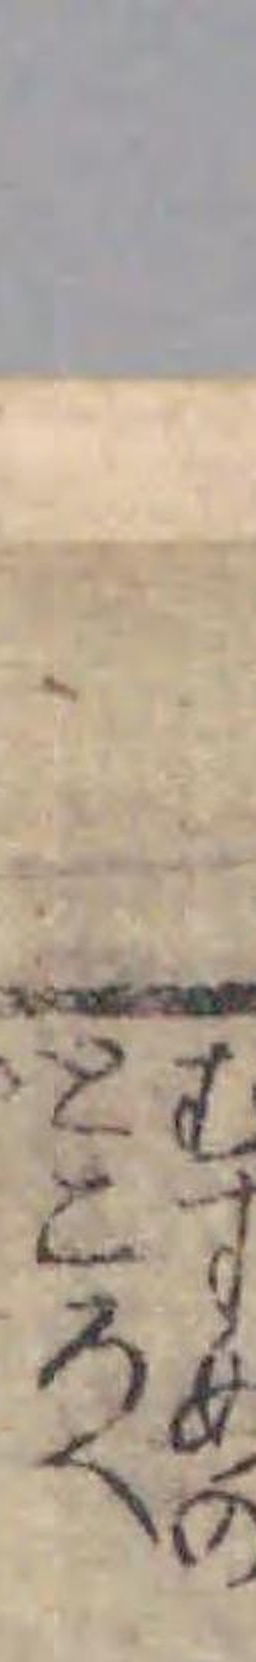ところへ
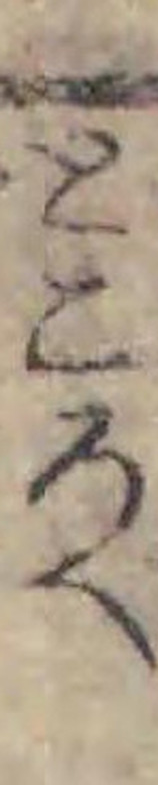ところへ
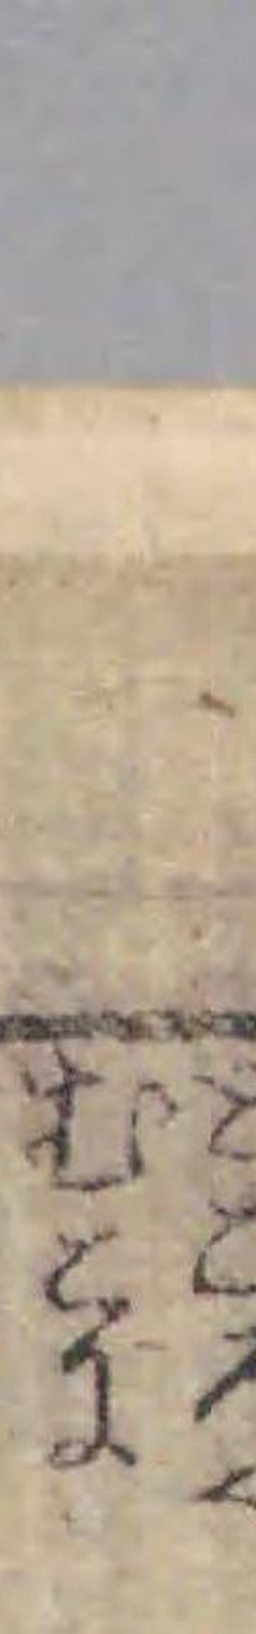むこに
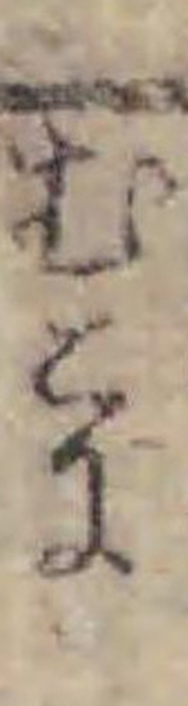むこに
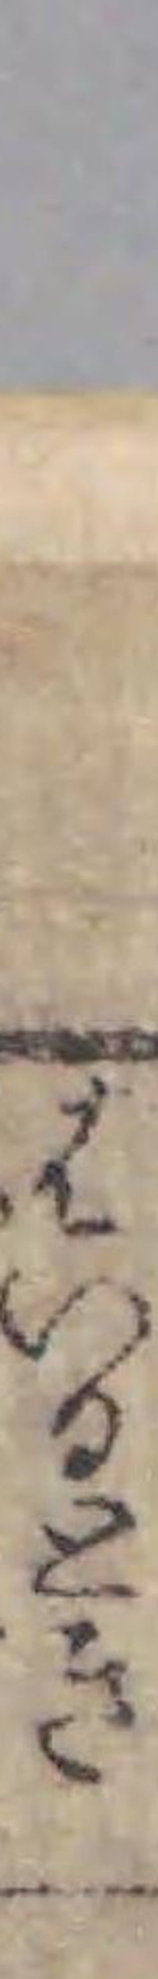はいるとき
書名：新鋳小判 : 3巻
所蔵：国立国会図書館 National Diet Library, JAPAN
